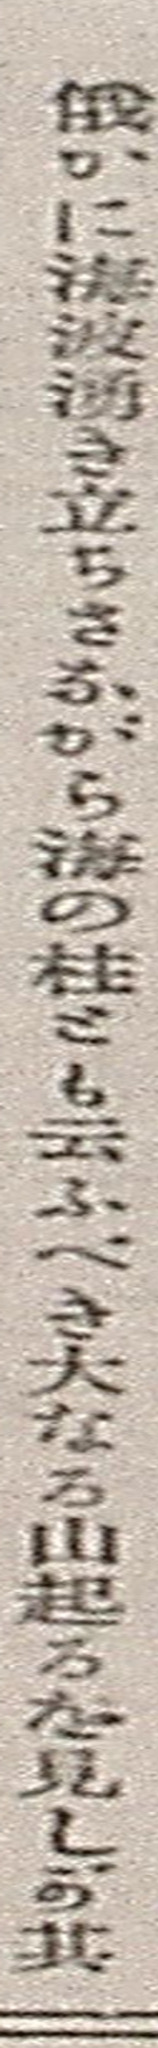俄かに海波湧き立ちさながら海の柱とも云ふべき大なる山起るを見しが其
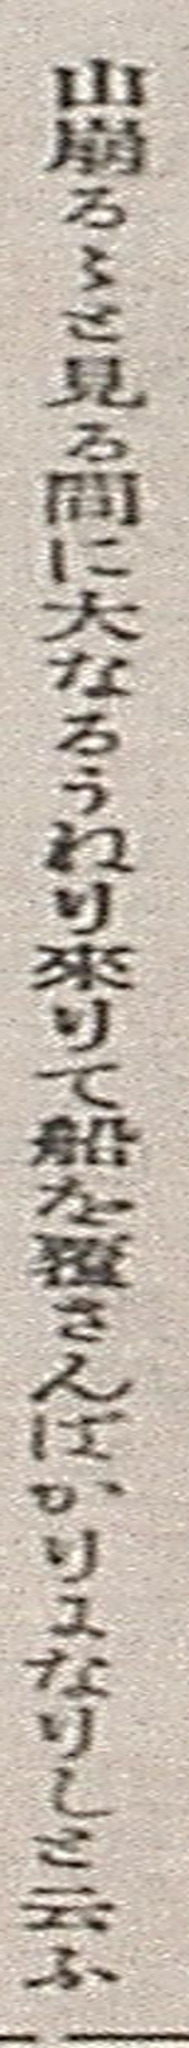山崩るゝと見る間に大なるうねり来りて船を覆さんばかりになりしと云ふ
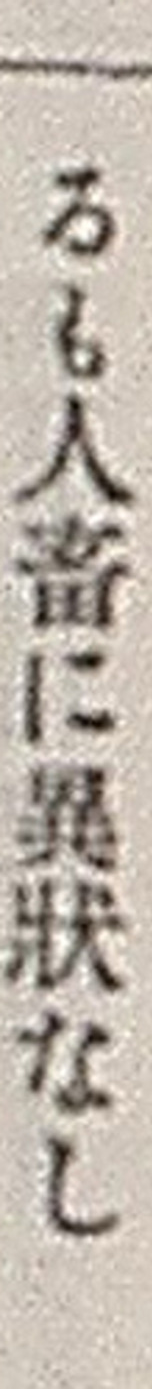るも人畜に異状なし
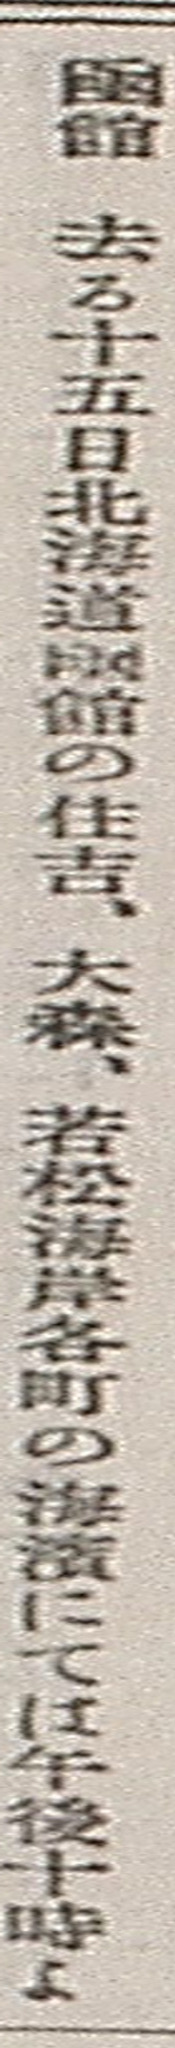函館去る十五日北海道函館の住吉、大森、若松海岸各町に海浜にては午後十時よ
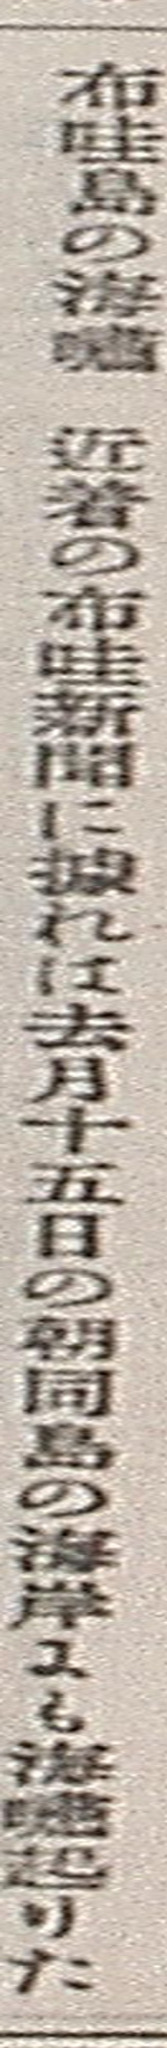布哇島の海嘯近着の布哇新聞に拠れは去月十五日の朝同島の海岸にも海嘯起りた
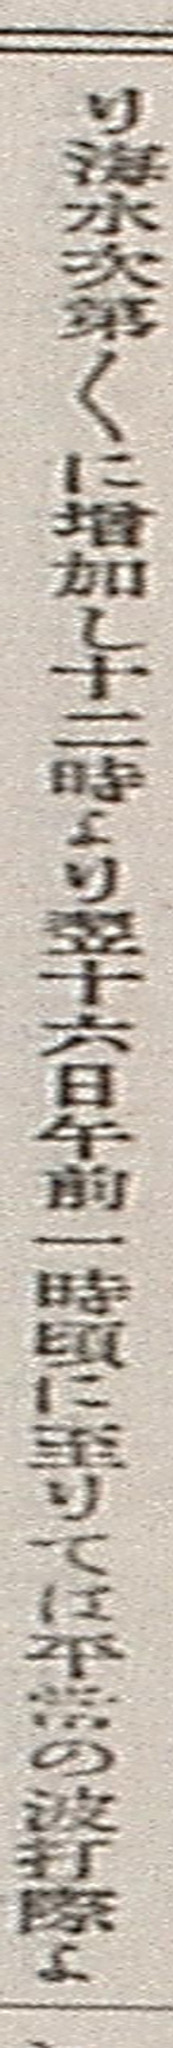り海水次第〳〵に増加し十二時より翌十六日午前一時頃に至りては平常の波打際よ
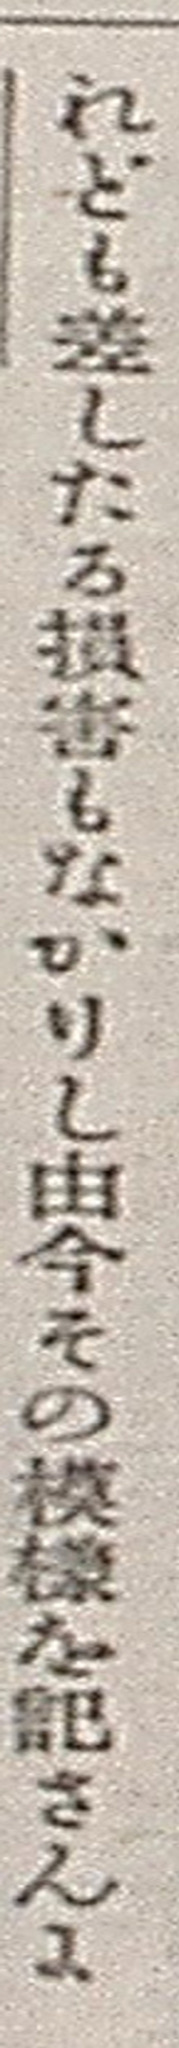れども差したる損害もなかりし由今その模様を記さんに
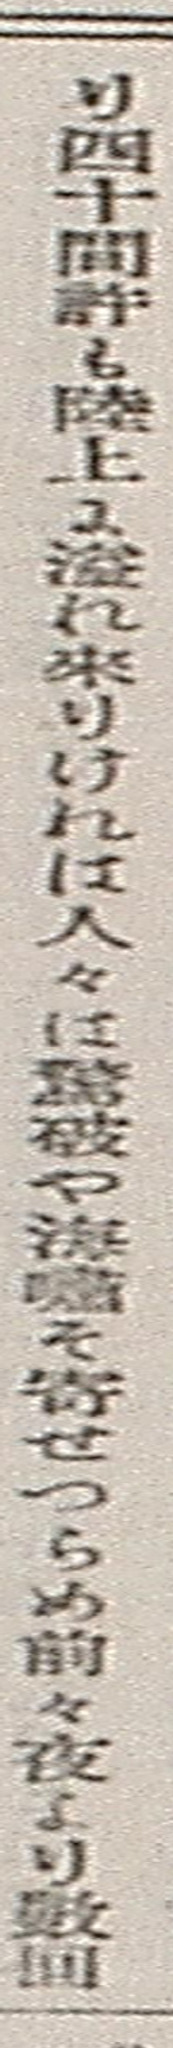り四十間許も陸上に溢れ来りければ人々は驚破や海嘯そ寄せつらめ前々夜より数回
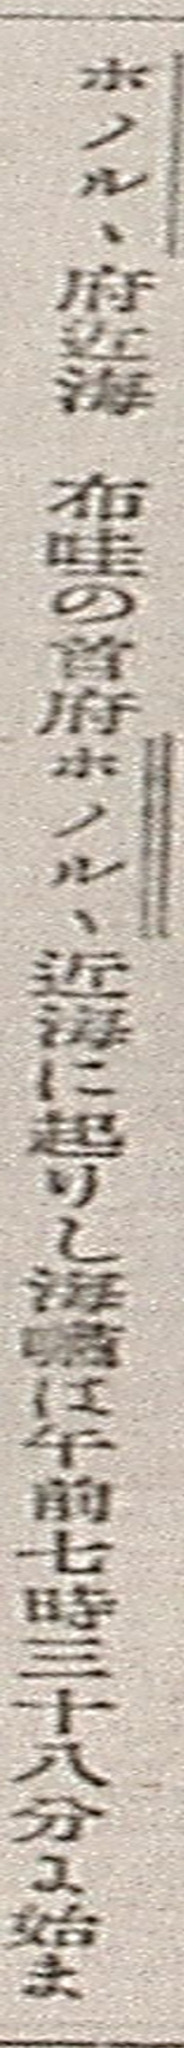ホノルヽ府近海布哇の首府ホノルヽ近海に起りし海嘯は午前七時三十八分に始ま
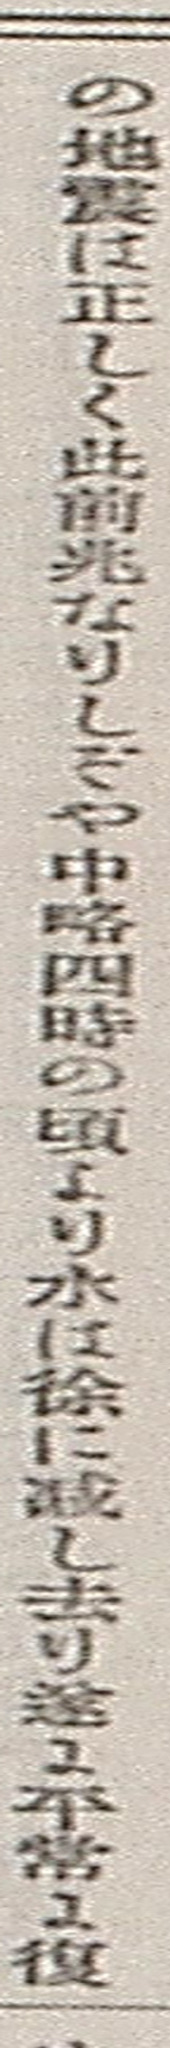の地震は正しく此前兆なりしぞや中略四時の頃より水は徐に減し去り遂に平常に復
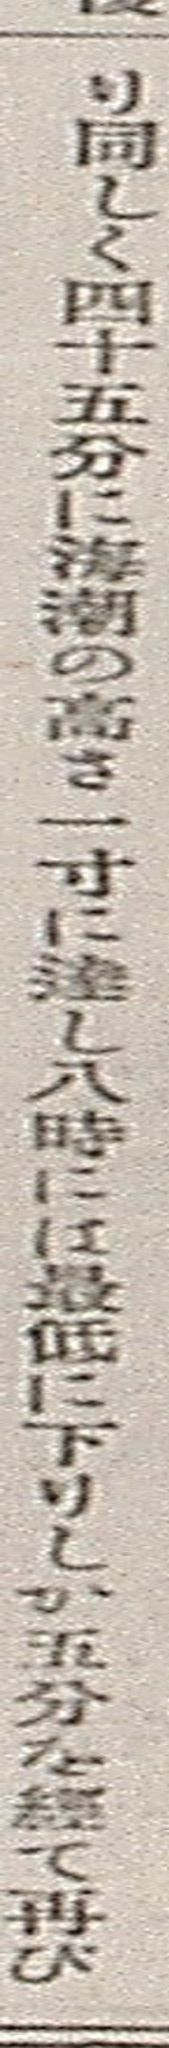り同しく四十五分に海潮の高さ一寸に達し八時には最低に下りしか五分を経て再び
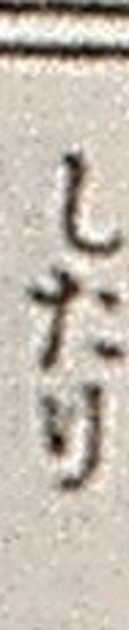したり
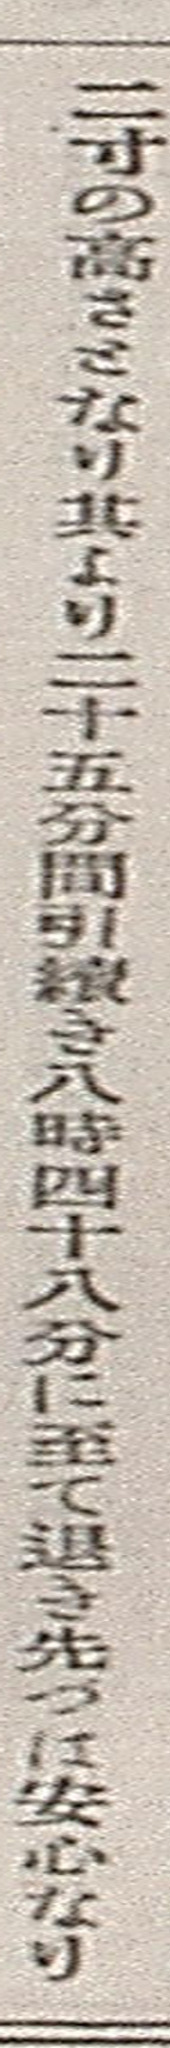二寸の高さとなり其より二十五分間引続き八時四十八分に至て退き先づは安心なり
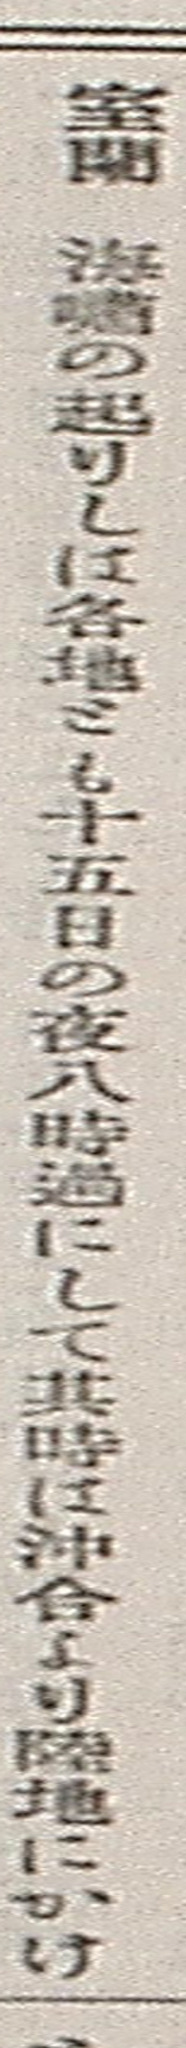室蘭海嘯の起りしは各地とも十五日の夜八時過にして其時は沖合より陸地にかけ
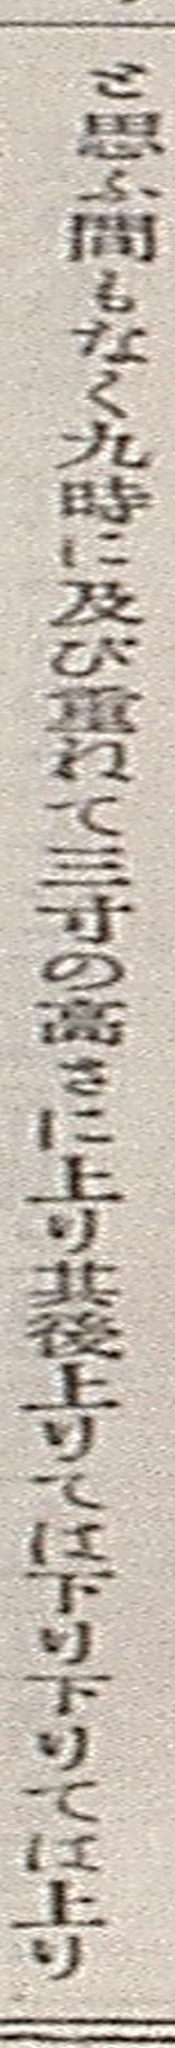と思ふ間もなく九時に及び重ねて三寸の高さに上り其後上りては下り下りては上り
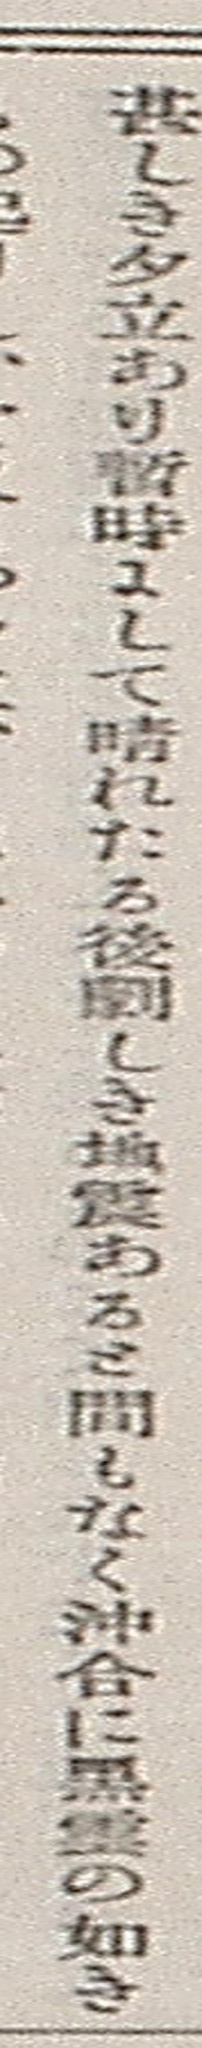甚しき夕立あり暫時にして晴れたる後劇しき地震あると間もなく沖合に黒雲の如き
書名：風俗畫報臨時増刊第百十九號　大海嘯被害録（中）
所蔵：東京大学地震研究所図書室 Earthquake Research Institute Library, The University of Tokyo, JAPAN
